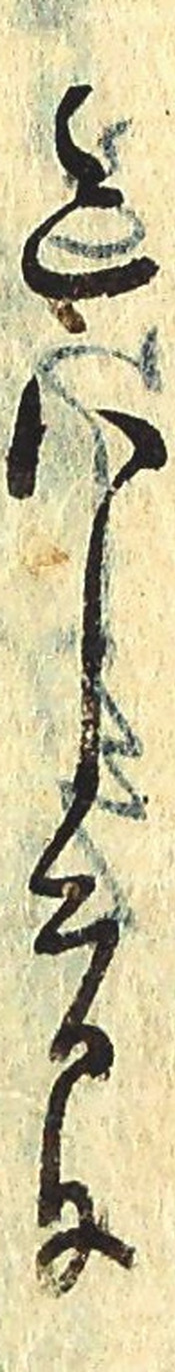巳八月二日夕
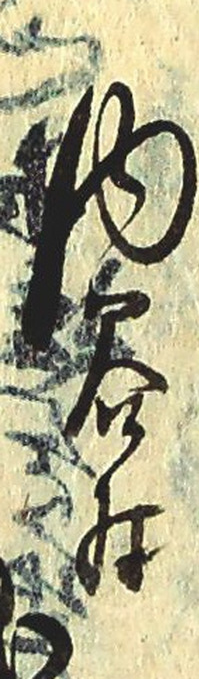内谷村
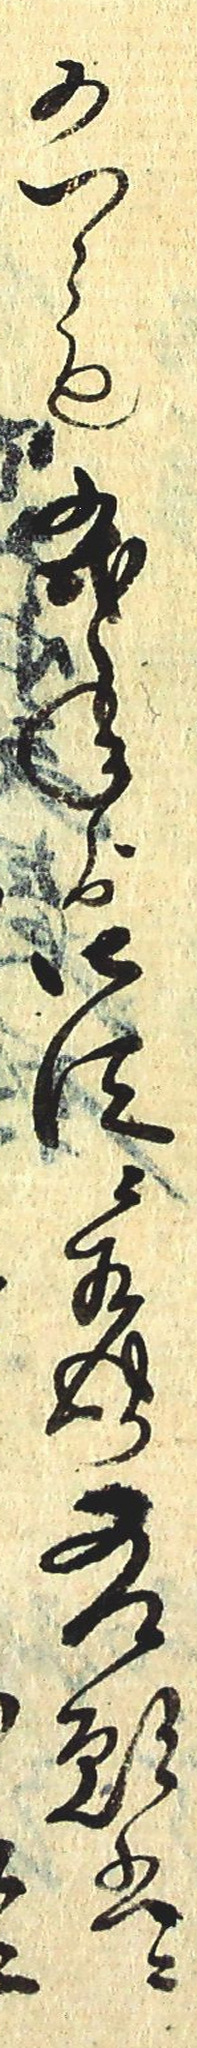右之通当年ゟ御法に相成り右願書に
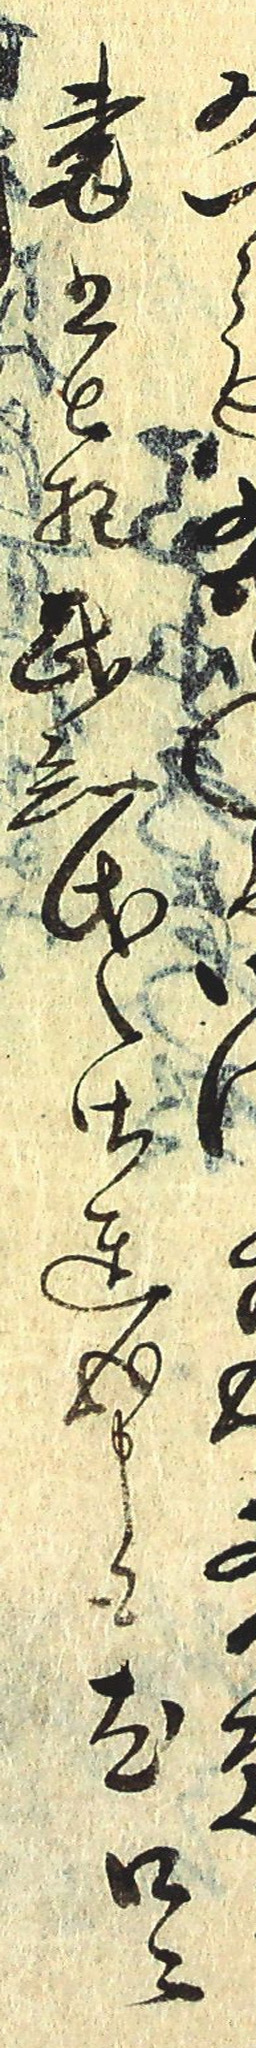裏書被遊武知氏へ御達成申候尤口に
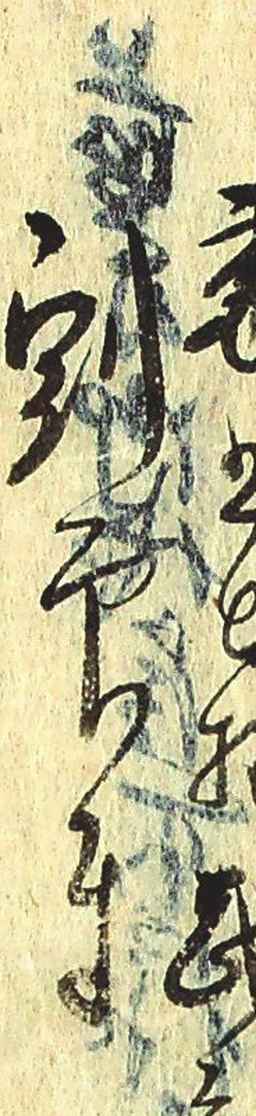割印付

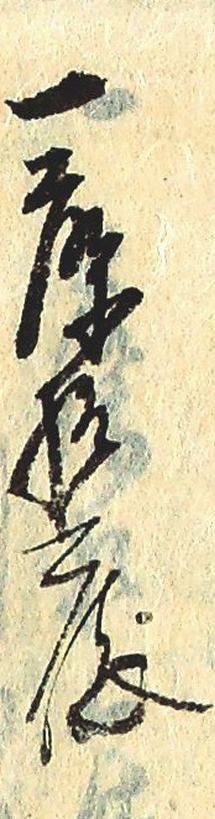一蒅拾六俵
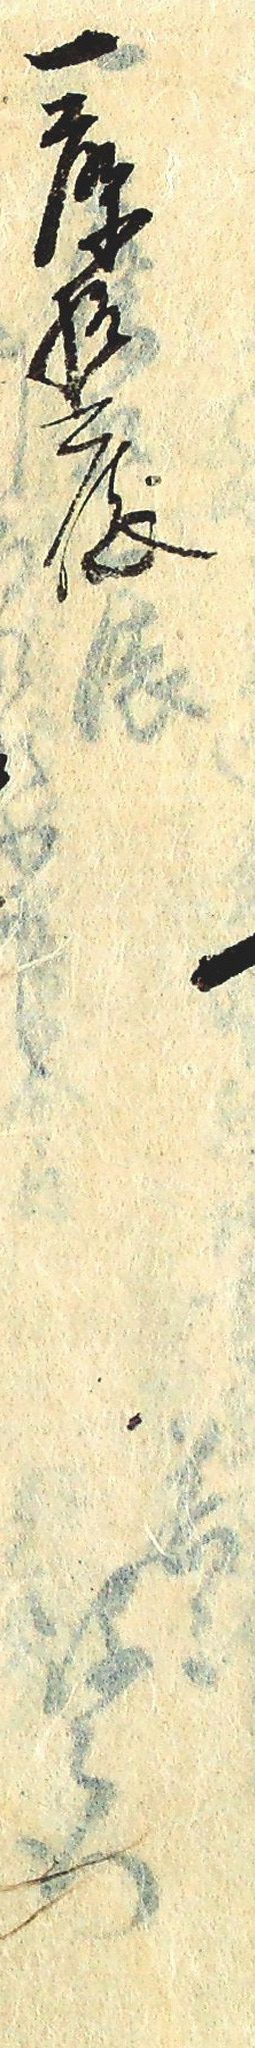一蒅拾六俵
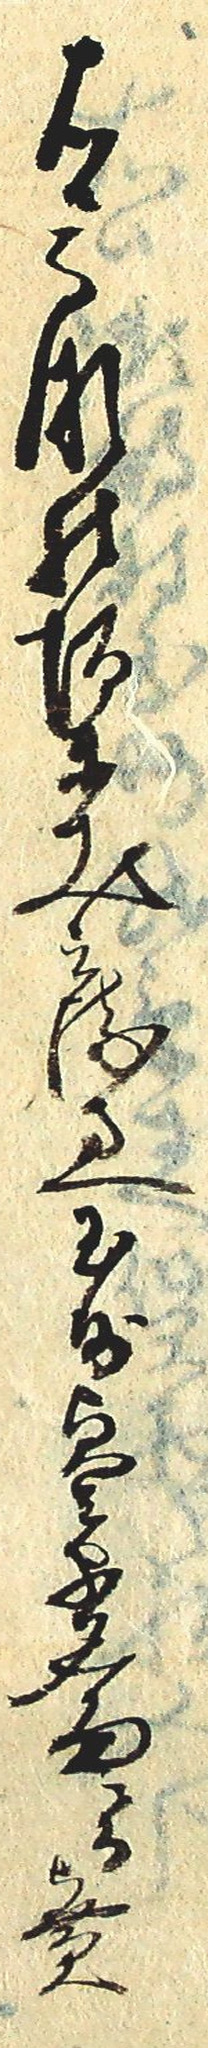右は高瀬村坂東丈兵衛方へ玉師貞兵衛名面にて売
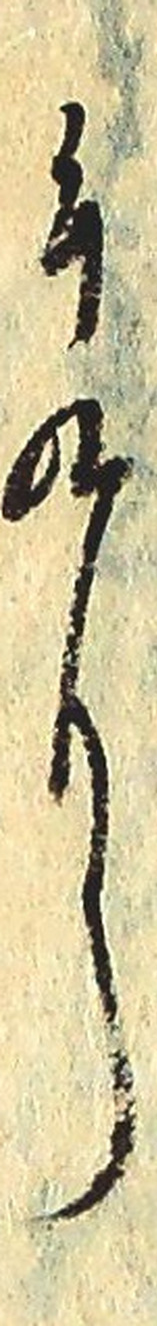午九月
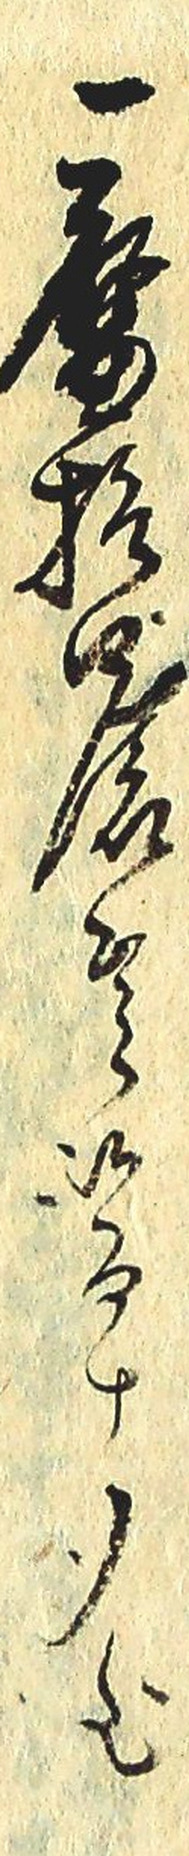一蒅拾四俵正み弍百十〆匁
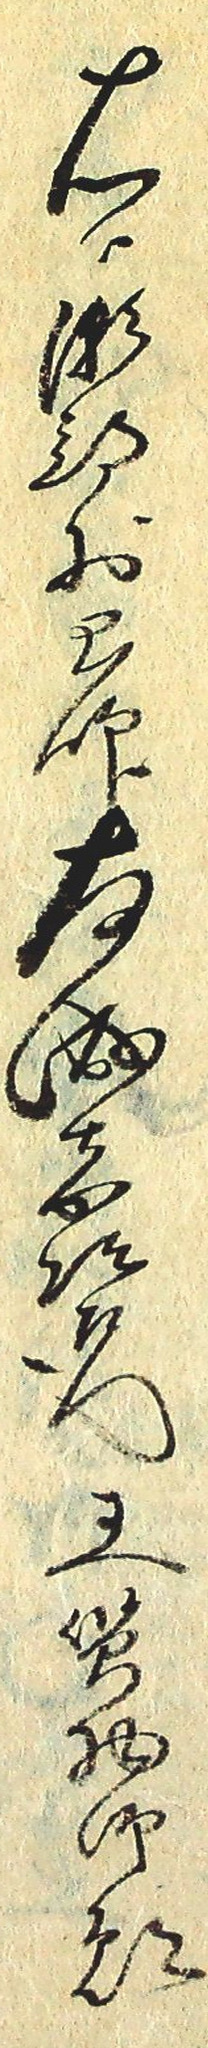右は瀬部村玉師友成嘉左衛門方へ質物御願
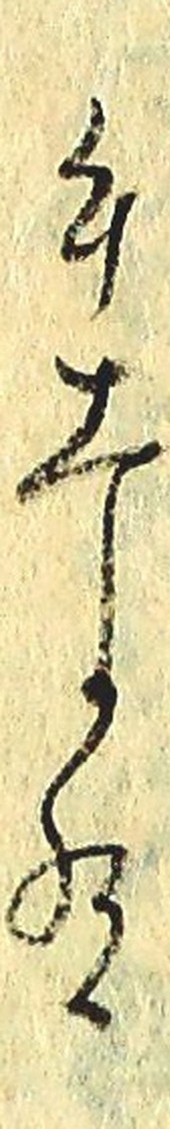午十一月九日
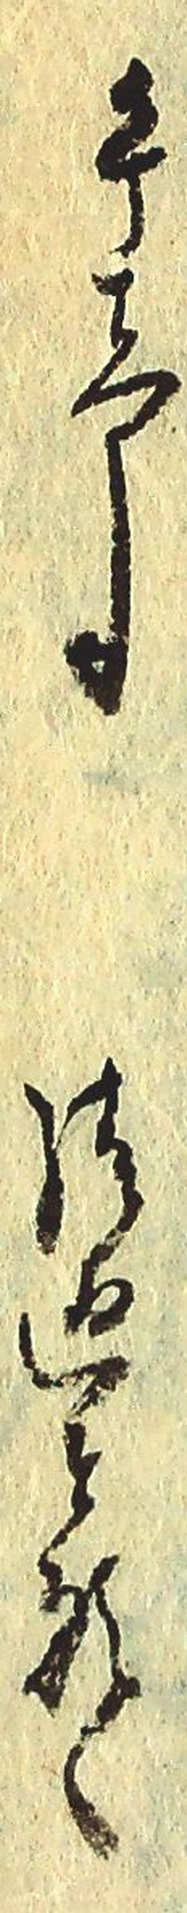午十二月請返奉願候
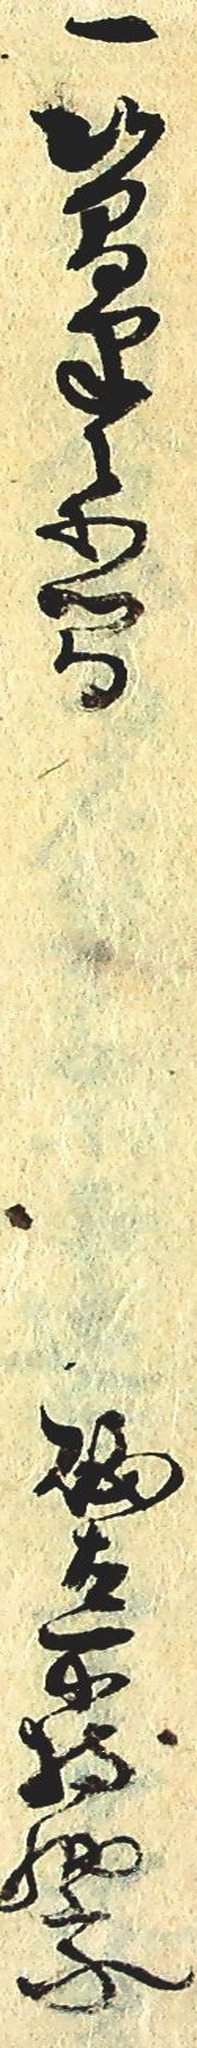一弍間半に五間磯太所持納家
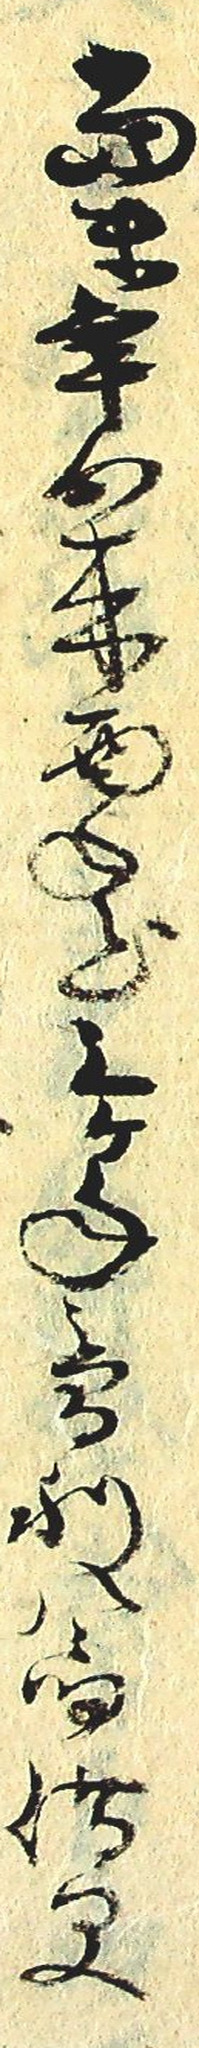当未年ゟ来酉年迄三ヶ年之間利八郎借受
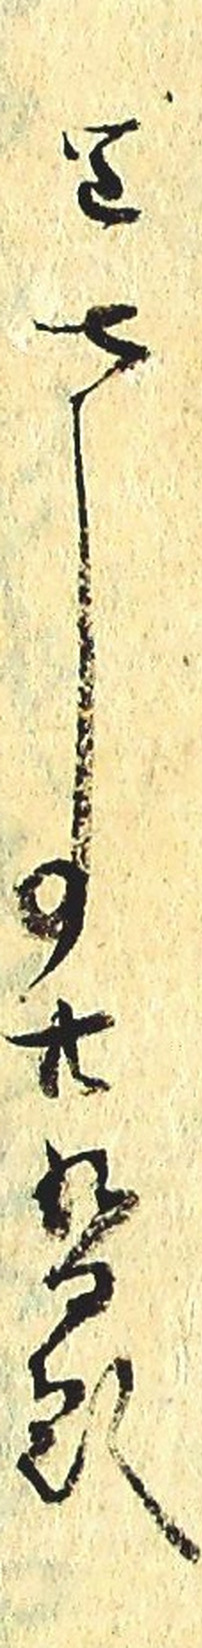閏七月廿九日願
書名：諸御願書控(弐番）
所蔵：鳴門教育大学 Naruto University of Education
